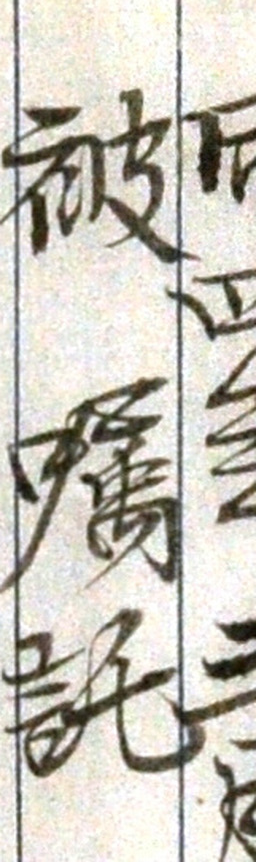被嘱託
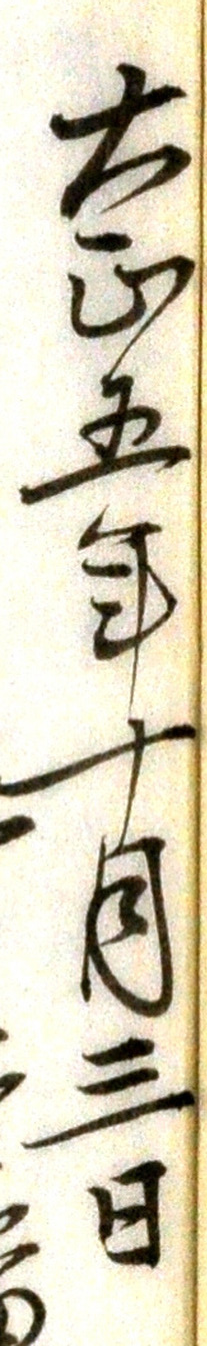大正五年十月三日
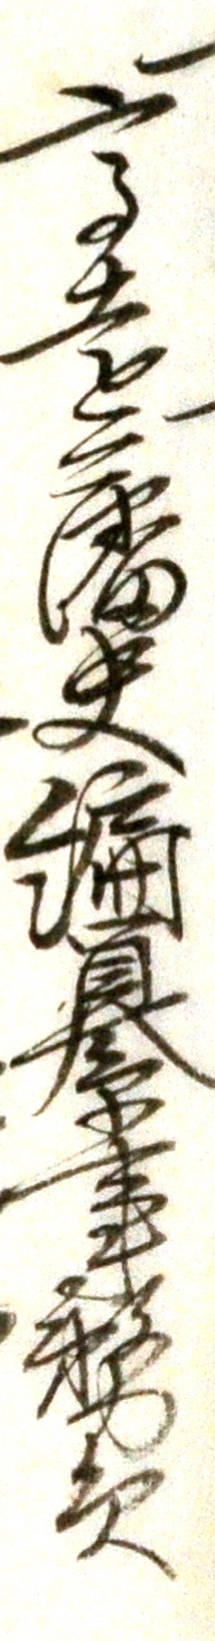高遠藩史編纂事務員
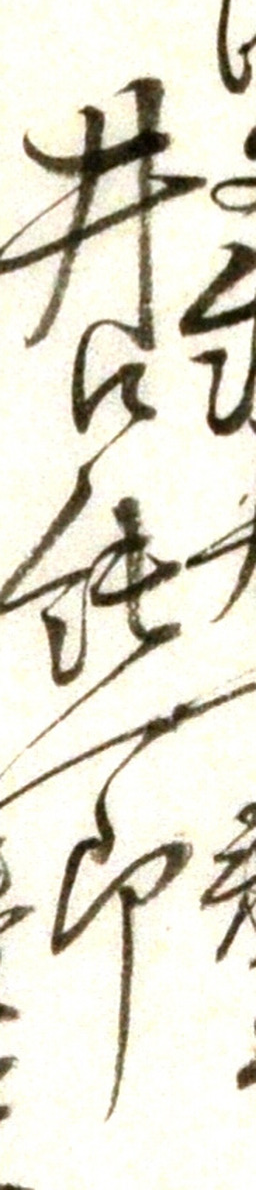井口純一郎

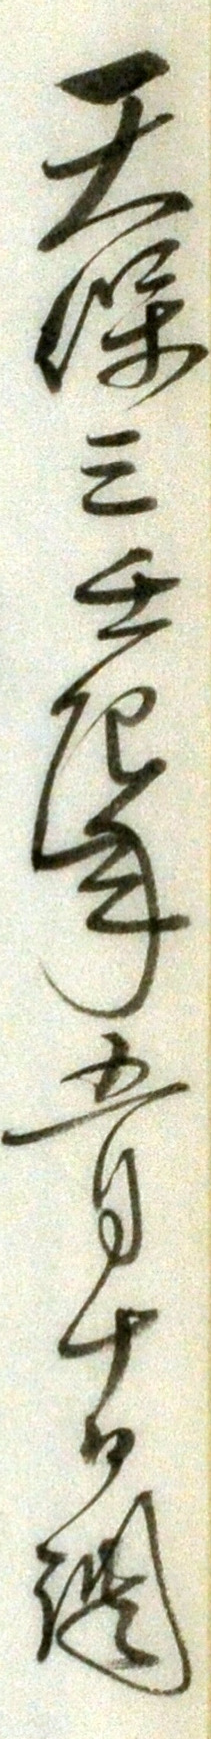天保三壬辰年五月十日調
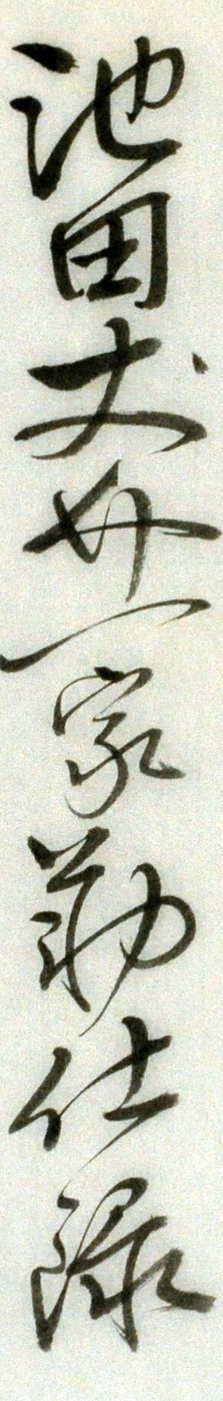池田丈介一家勤仕録
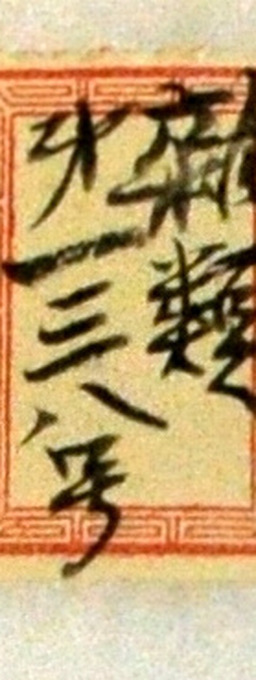第一三八号

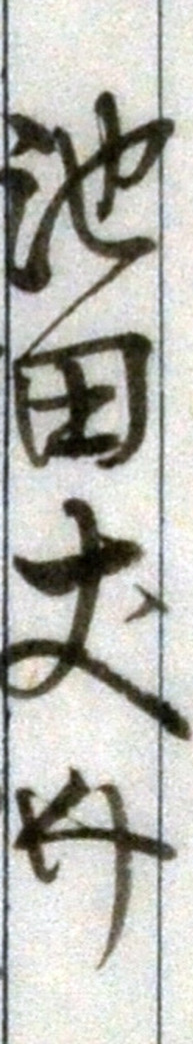池田丈介
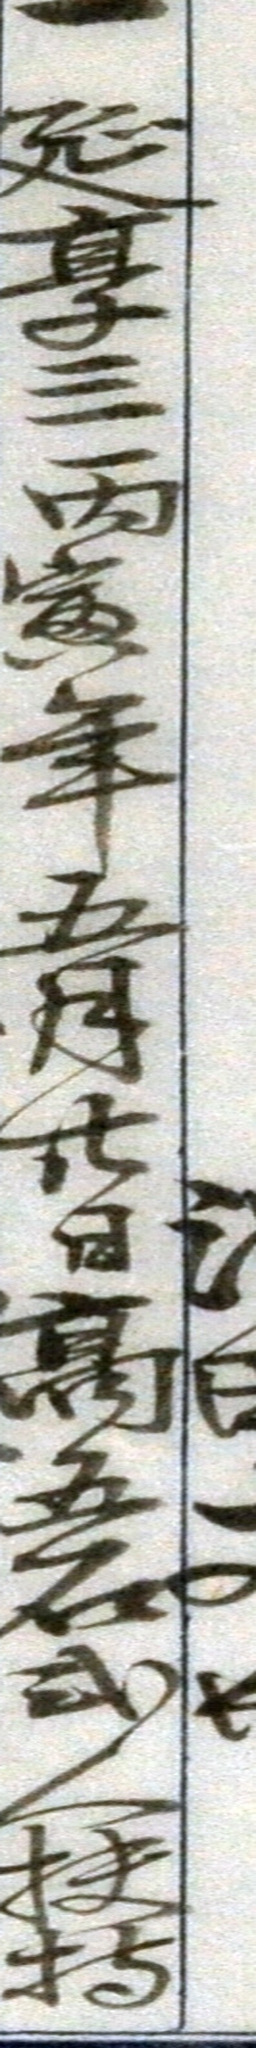一延享三丙寅年五月廿日高五石弐人扶持
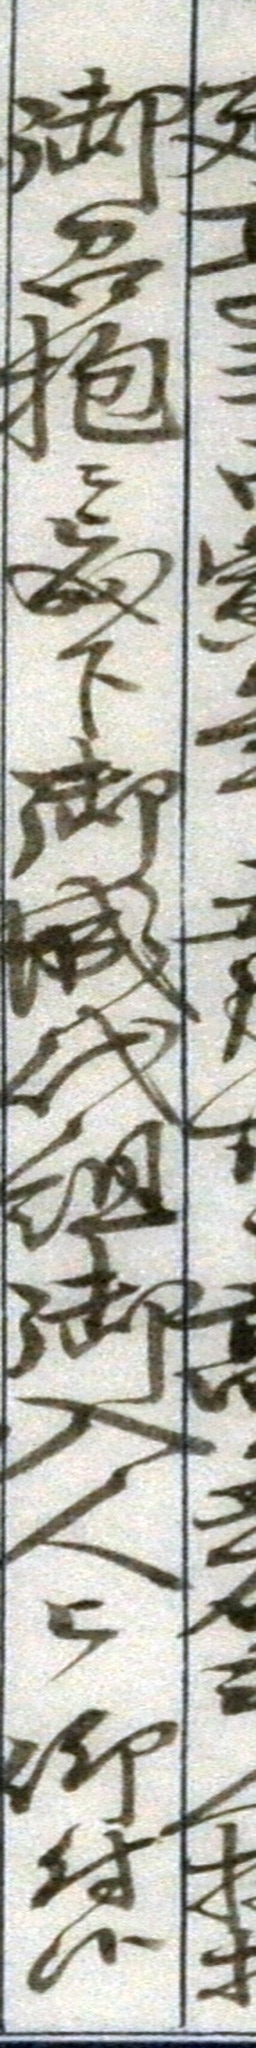御召抱被成下御城代組御入人被仰付候
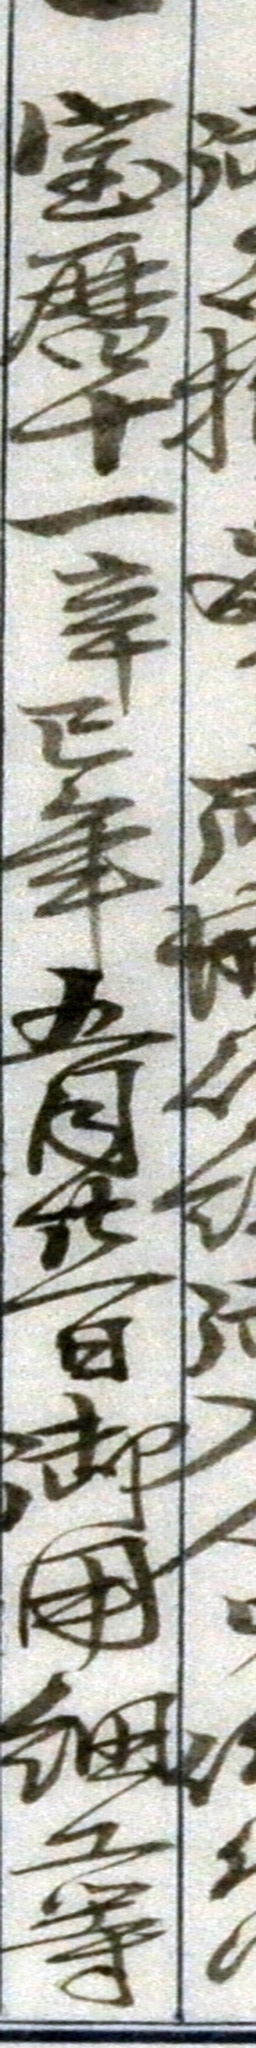一宝暦十一辛巳年五月廿一日御用細工等
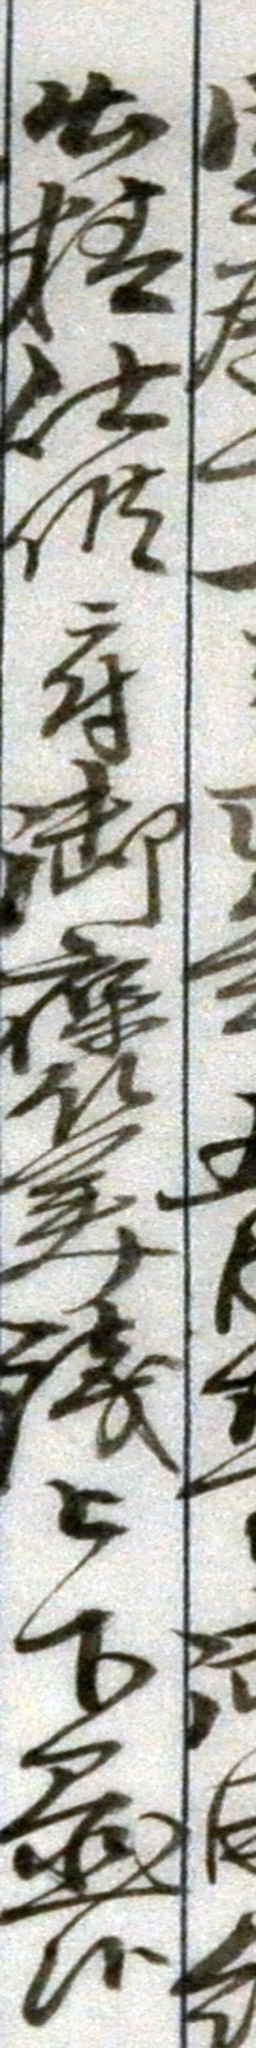出精仕候ニ付御褒美銭被下置候
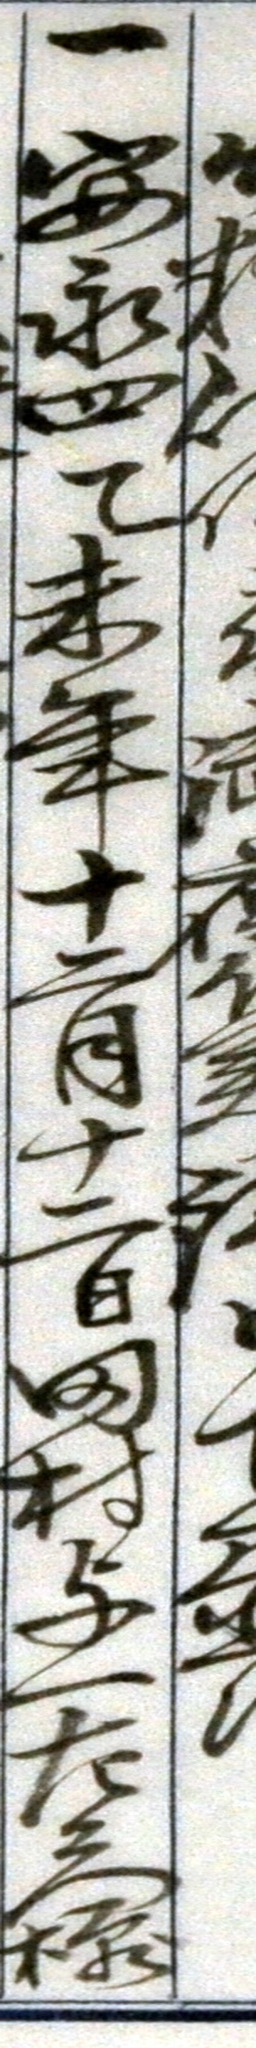一安永四乙未年十二月十二日田村与一左衛門様
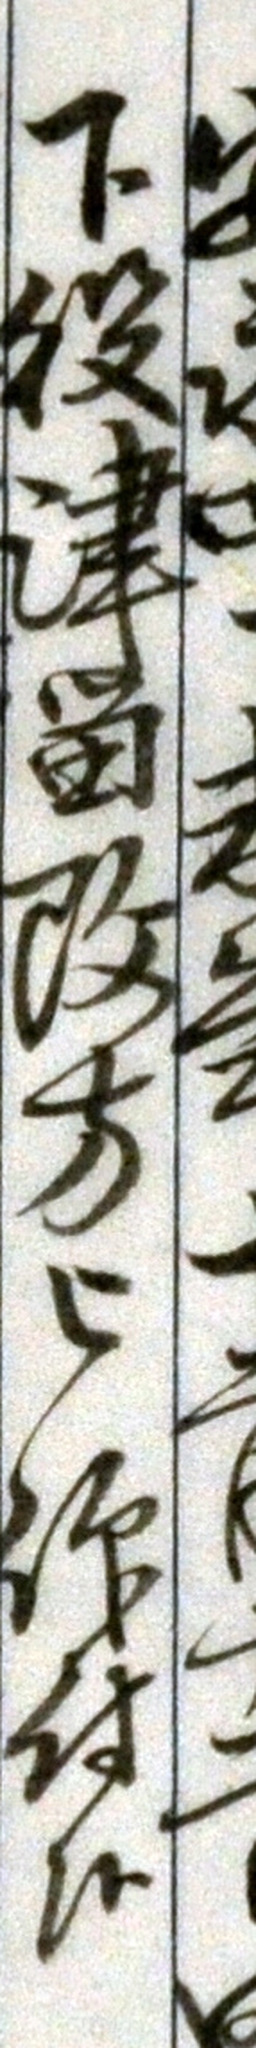下役津留改方被仰付候
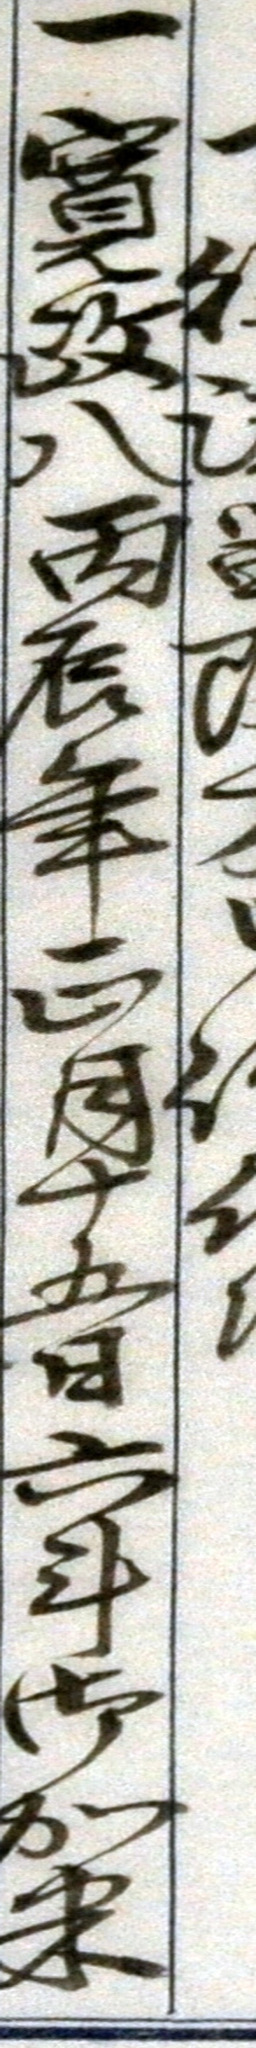一寛政八丙辰年正月十五日六斗御加米
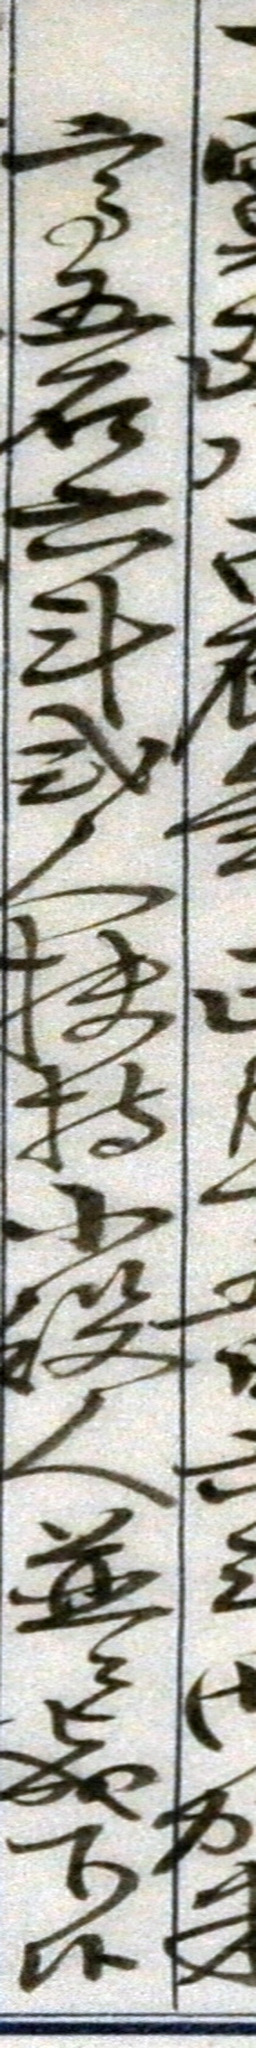高五石六斗弐人扶持小役人並ニ被成下候
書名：三好氏先代以来勤仕録、池田丈介一家勤仕録
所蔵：伊那市立高遠町図書館・合同会社AMANE
